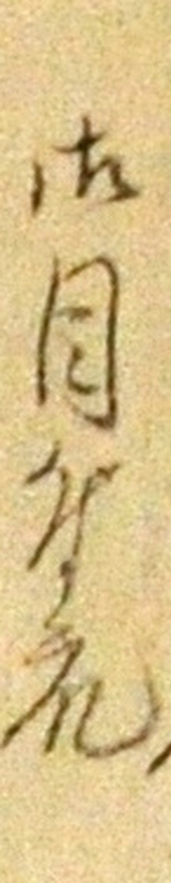御目付衆
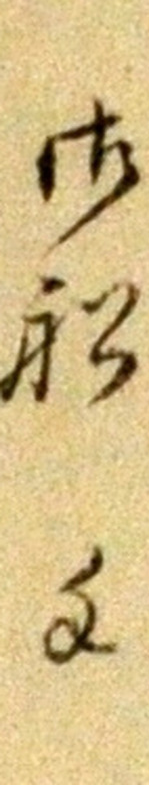御船手
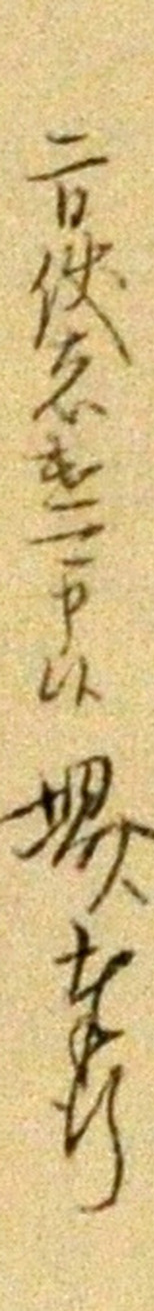二日使者遣可申候堺奉行
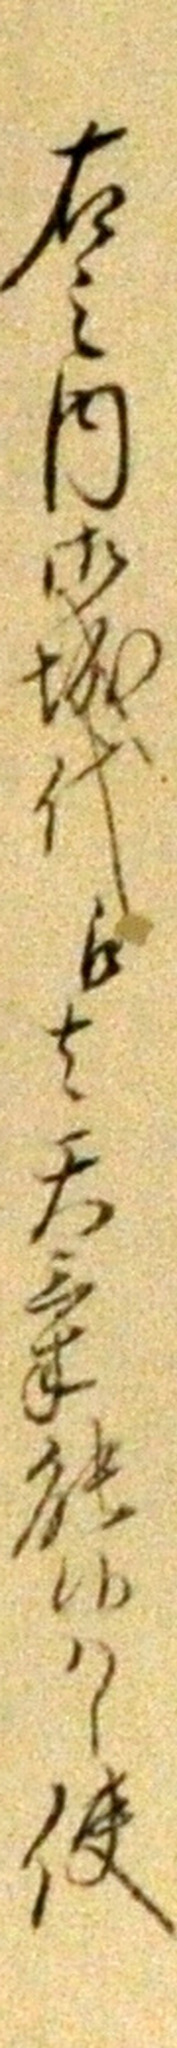右之内御城代えは天気能候ハヽ使
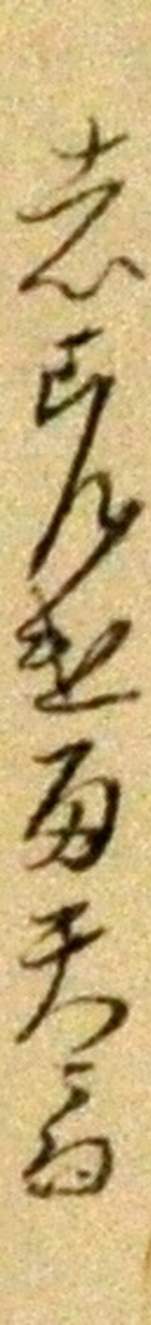者差遣雨天ニ而
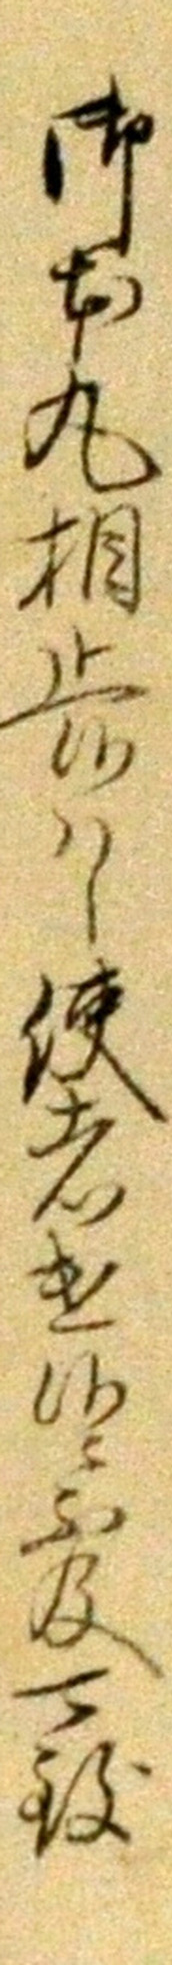御本丸相止候ハヽ使者遣候ニ不及可致
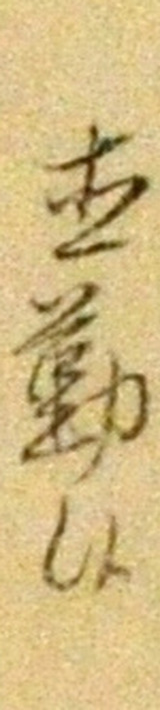直勤候
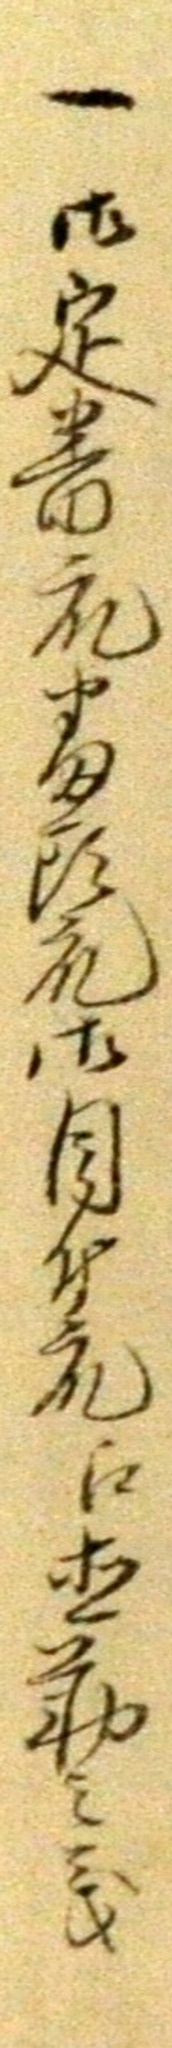一御定番衆番頭衆御目付衆え直勤之義
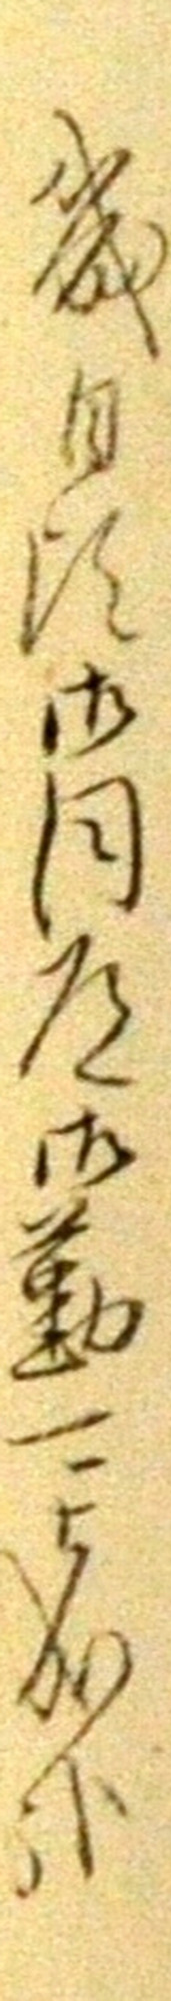幾日頃御同道御勤可被成哉

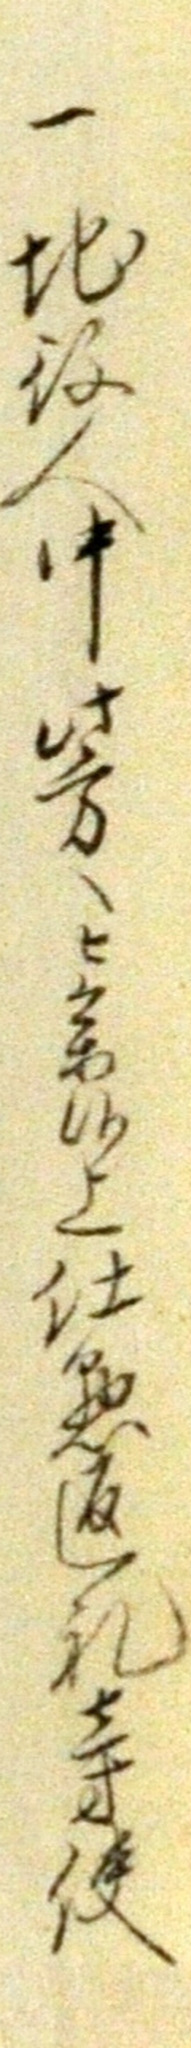一地役人中此方へ被参候上仕懸返礼旁使
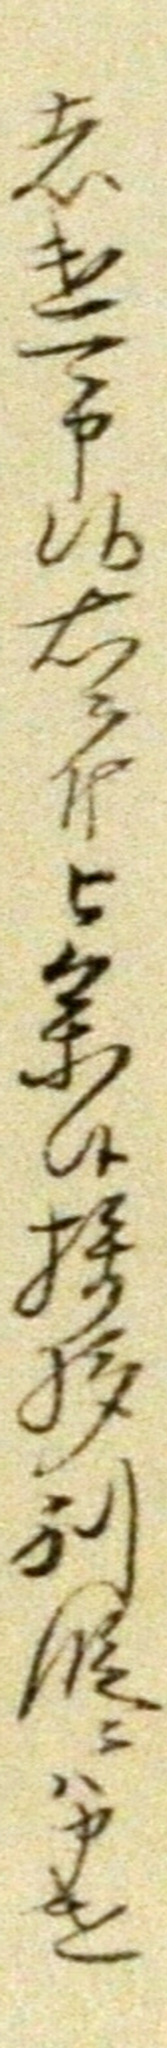者遣可申候右ニ付被参候挨拶別段ニハ申遣
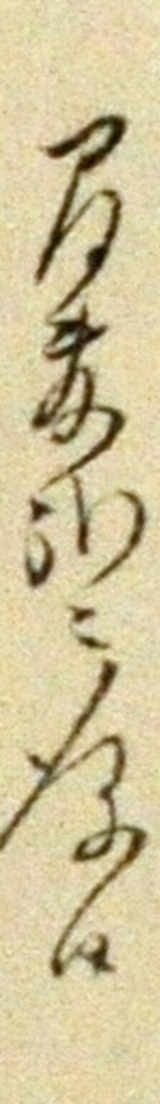間敷哉ニ存候
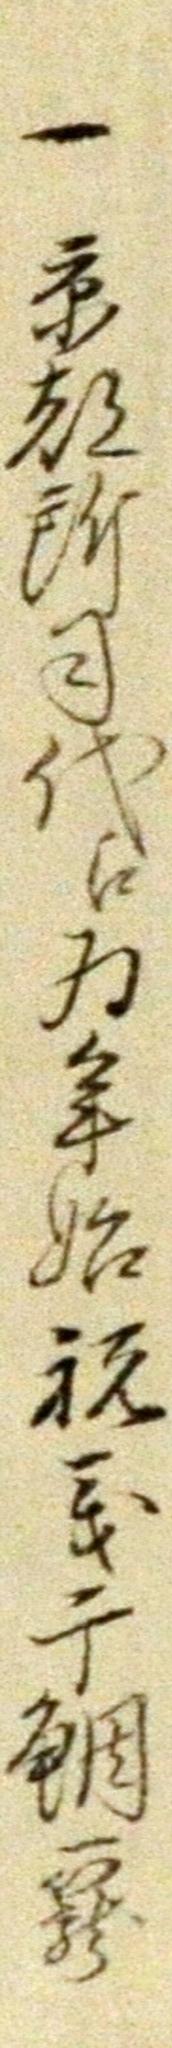一京都所司代え為年始祝義干鯛籠
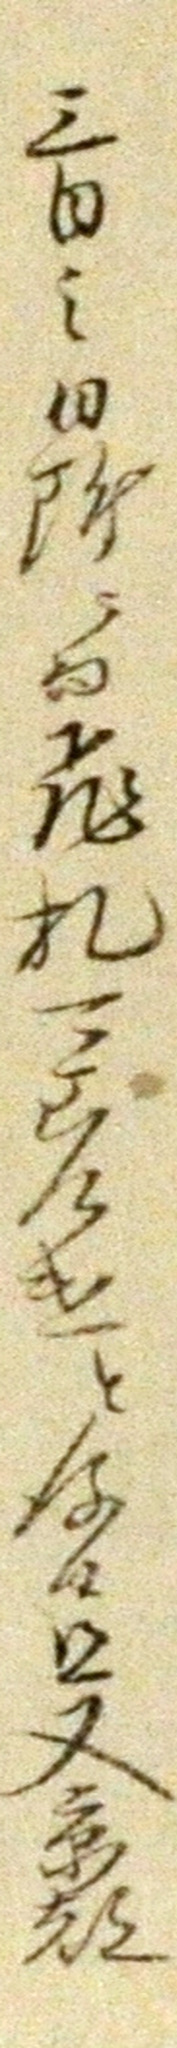三日之日附ニ而飛札可差遣と存候且又京都
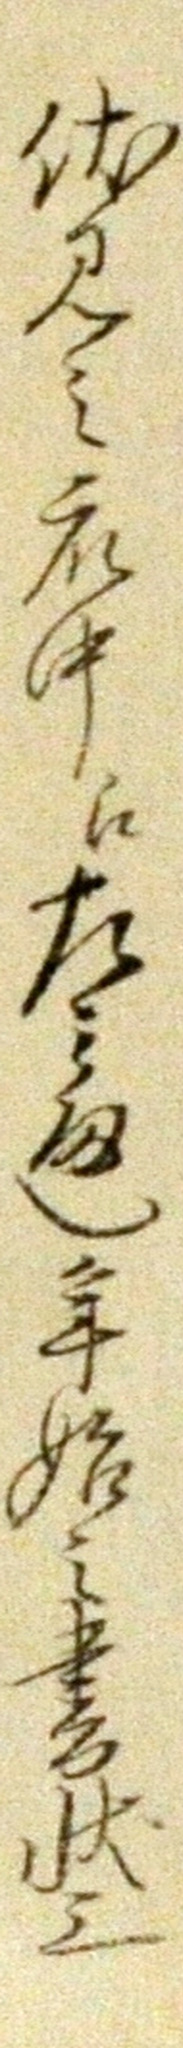伏見之衆中え左之通年始之書状三
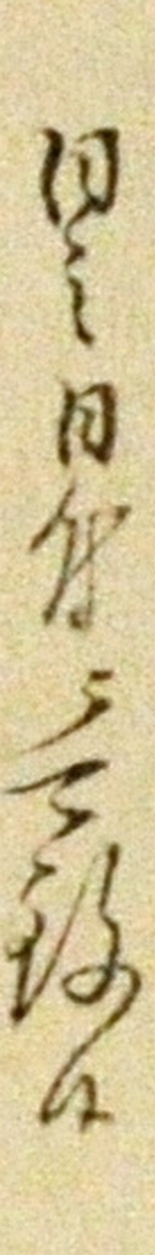日之日付ニ可致候
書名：大阪加番関係諸書留〔一括〕
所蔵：伊那市立高遠町図書館・合同会社AMANE
